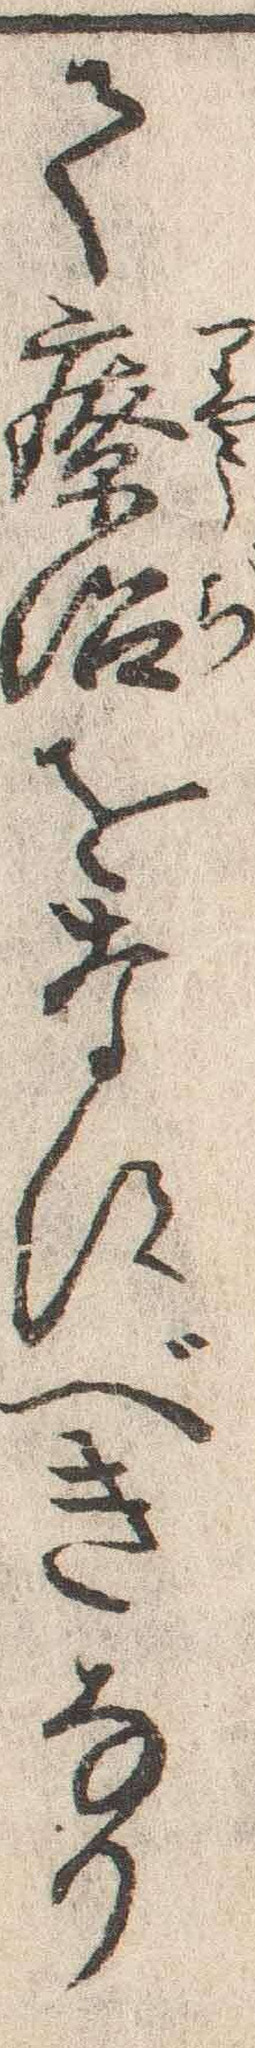て療治をなすべきなり
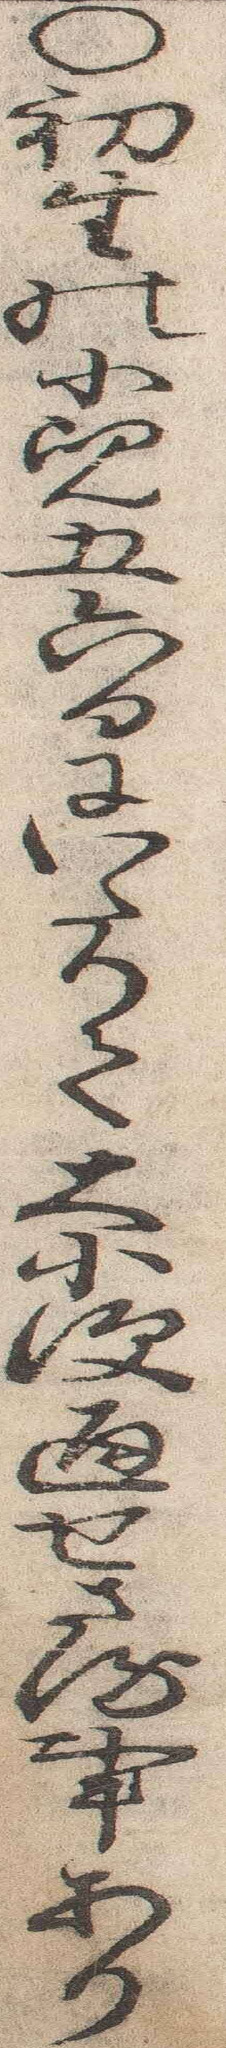○初生の小児五六日にいたりて大小便通せさる事あり

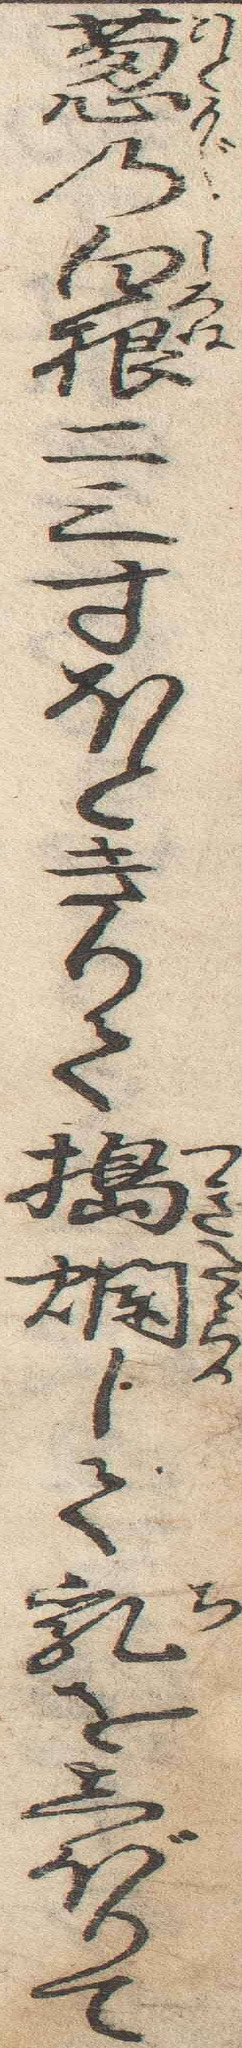葱の白根二三寸ほときりて搗爛して乳をしぼりて
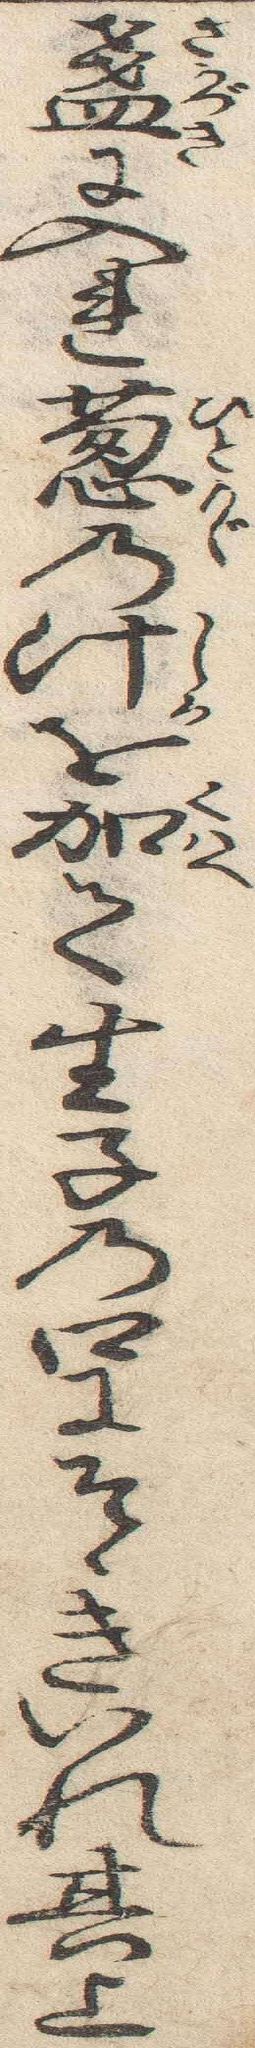盞に入れ葱の汁を加て生子の口にそゝきいれ其上
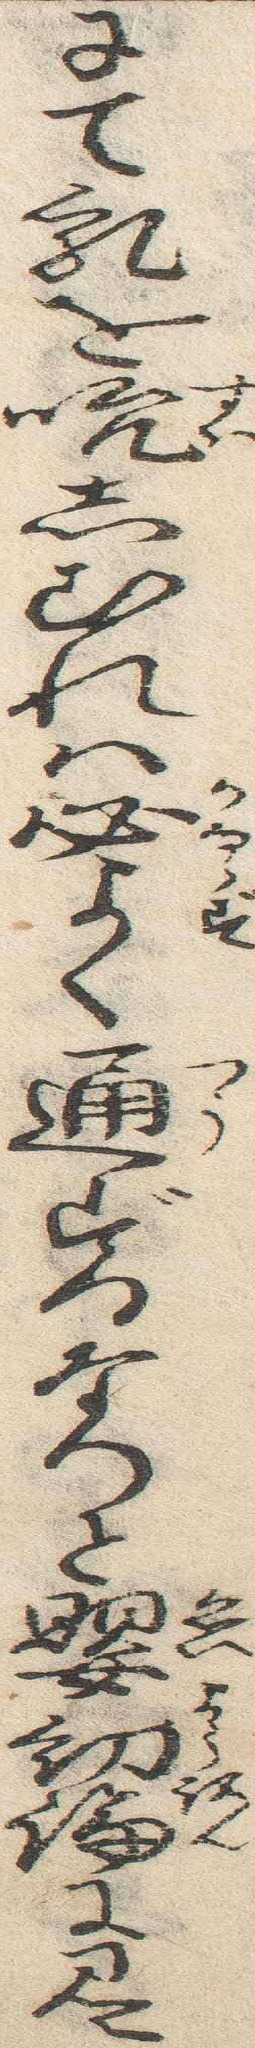にて乳を吮しむれは必よく通ずるなりと嬰幼論に見え
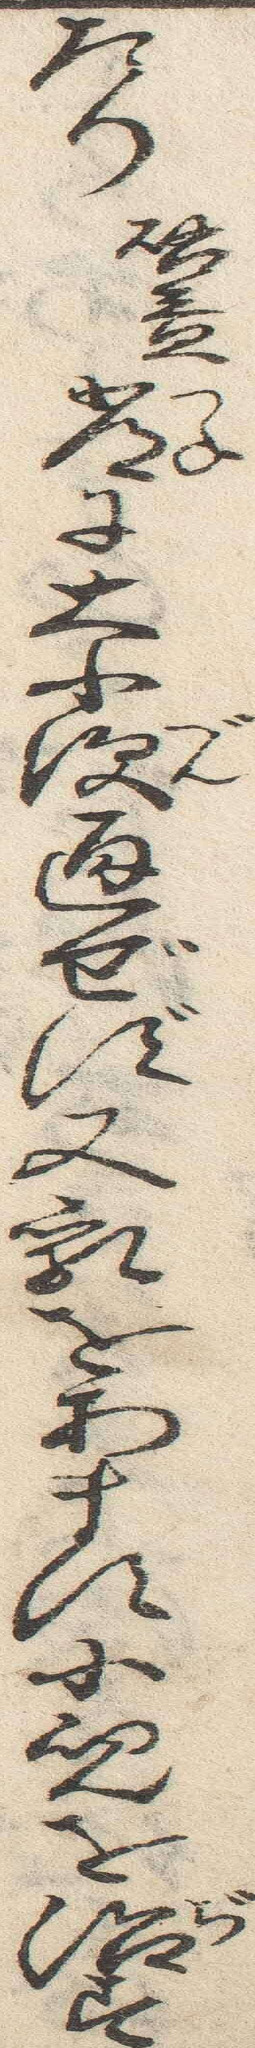たり啓益常に大小便通ぜず又乳をあます小児を治す
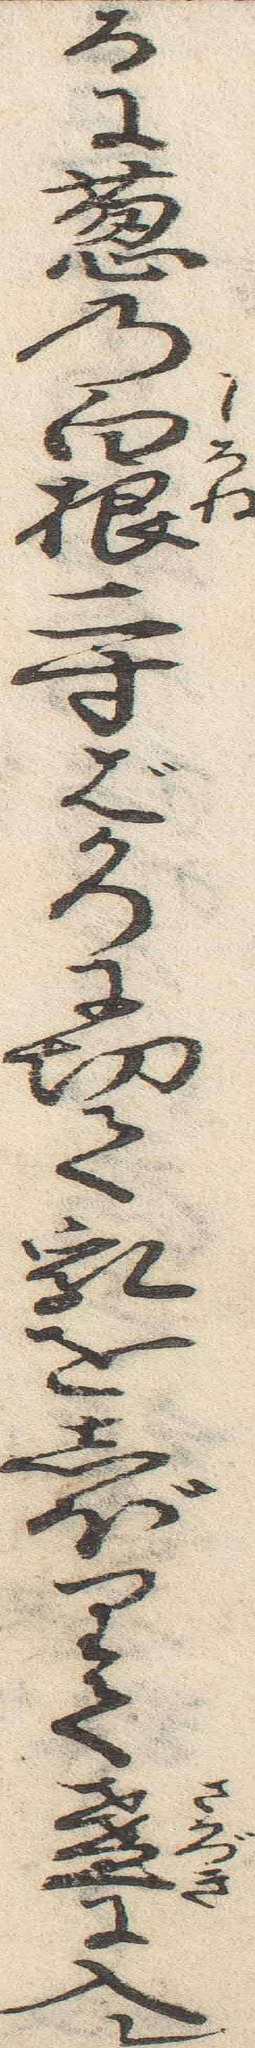るに葱の白根二寸ばかりに切て乳をしぼりて盞に入れ
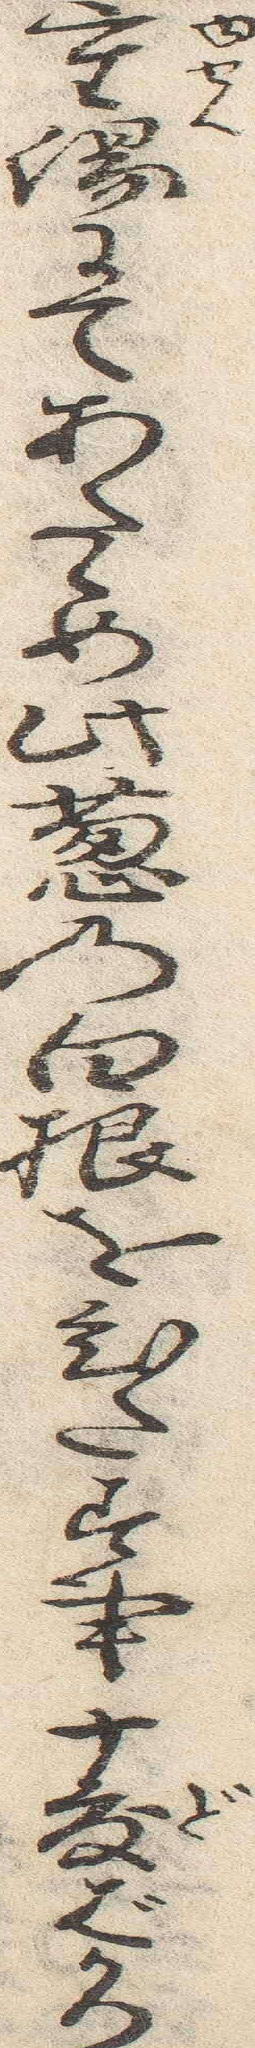重湯にてあたゝめ此葱の白根をひたす事十度ばかり
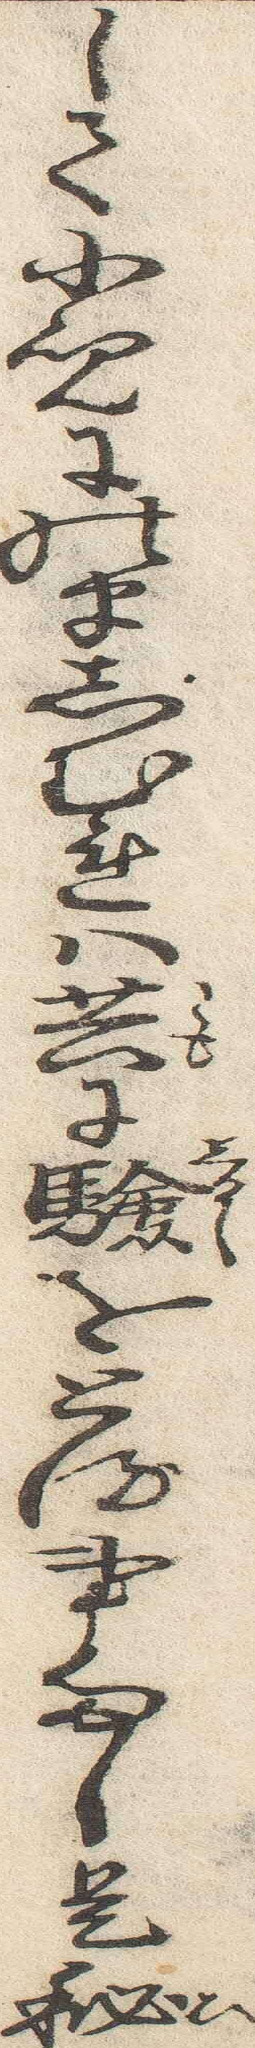して小児にのましむれは共に験をとる事多し是秘
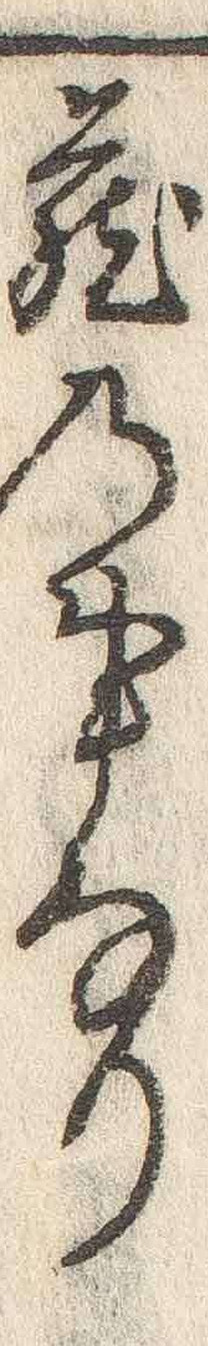蔵の事なり
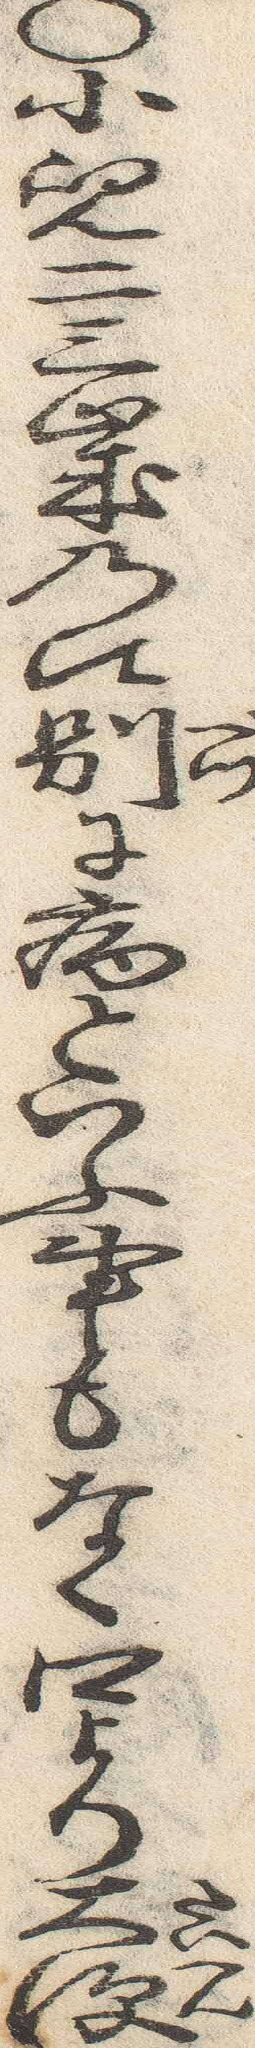○小児二三歳の比別に病といふ事もなく口より大便
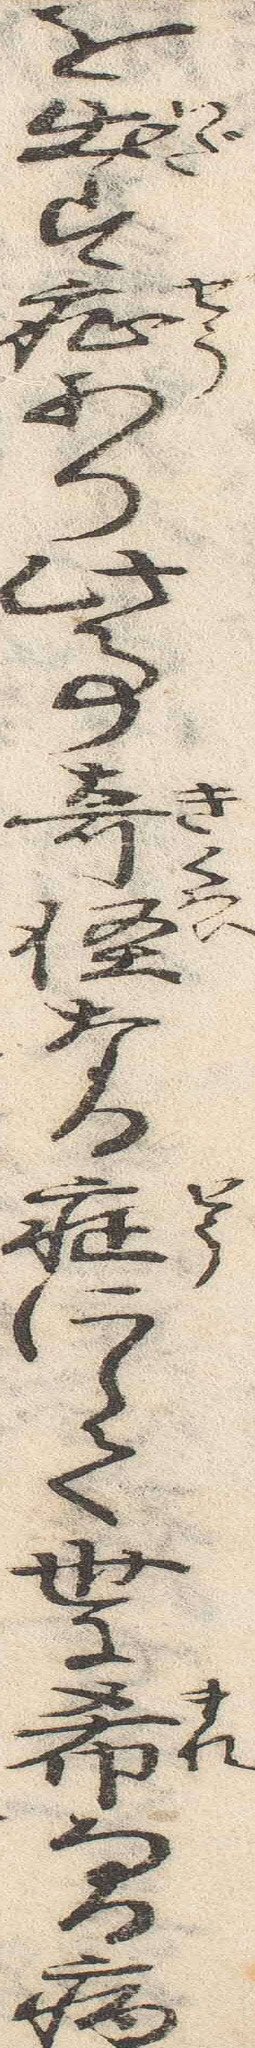を出す症あり此事奇怪なる症にして世に希なる病
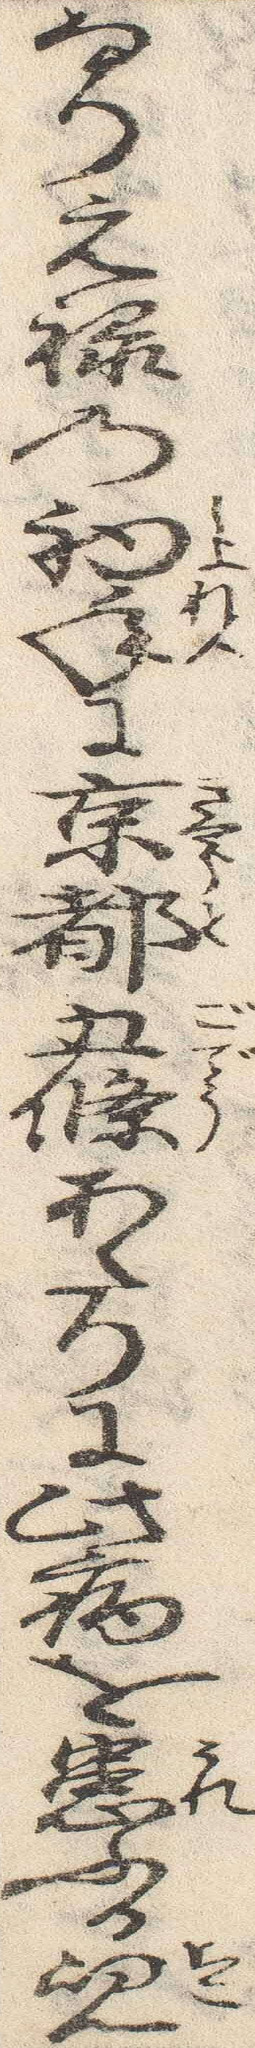なり元禄の初年に京都五条あたりに此病を患ふる児
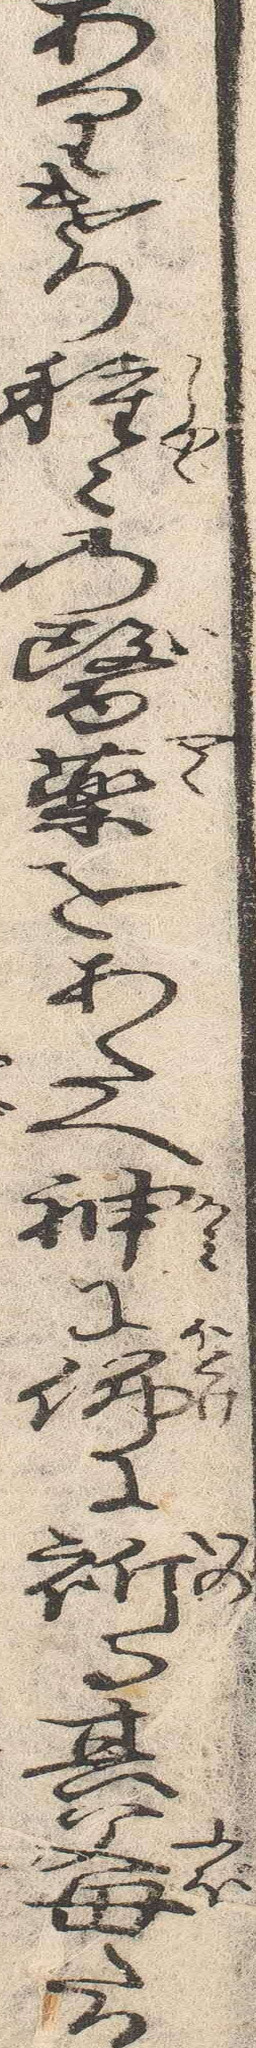ありけり種々の医薬をあたへ神に仏に祈る其父母たる
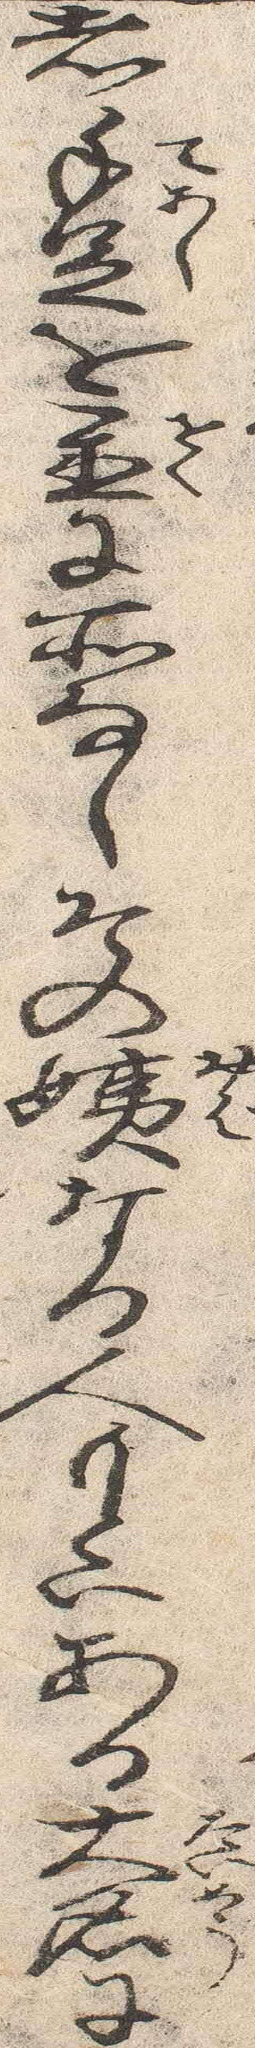者手足を置に所なしその姨なる人もとはある大名に
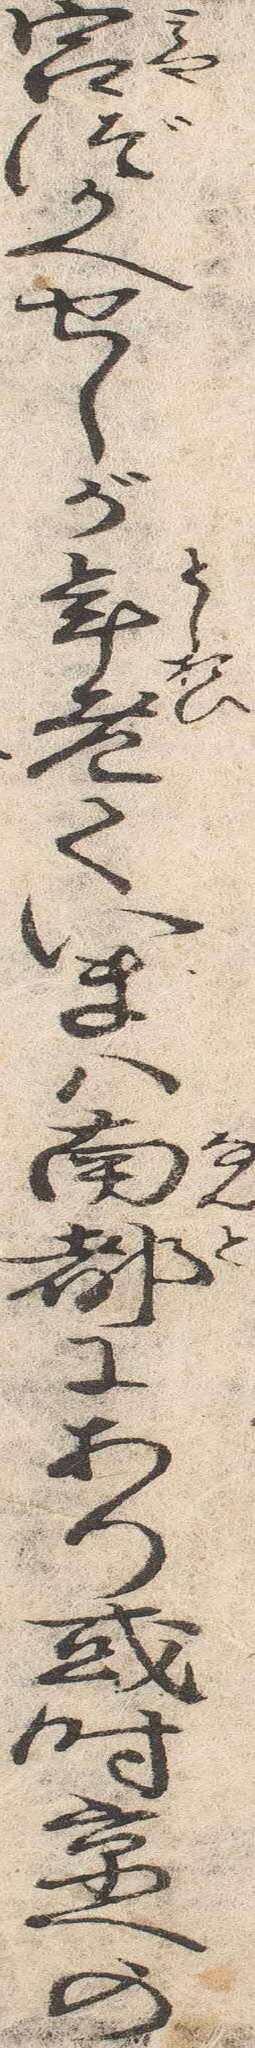宮づかへせしが年老ていまは南都にあり或時京への
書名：小児必用養育草
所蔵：東京学芸大学附属図書館 国文学研究資料館
